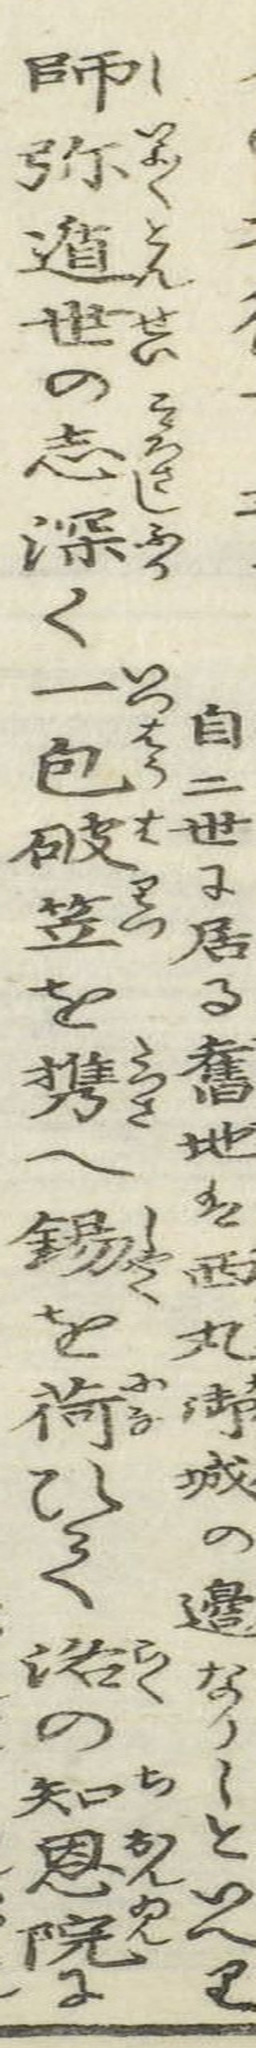師弥遁世の志深く一包破笠を携へ錫を荷ひて洛の知恩院に
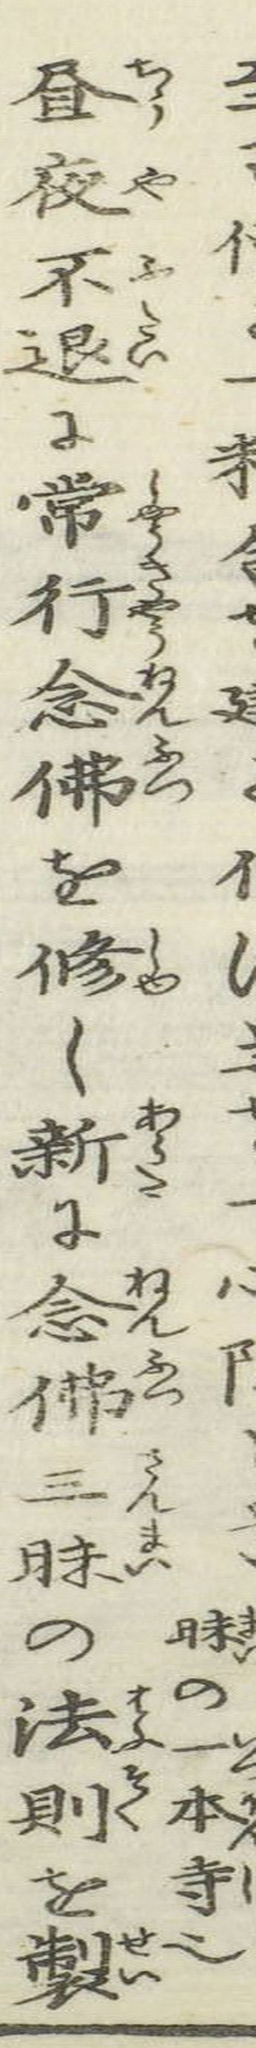昼夜不退に常行念佛を修し新に念佛三昧の法則を製
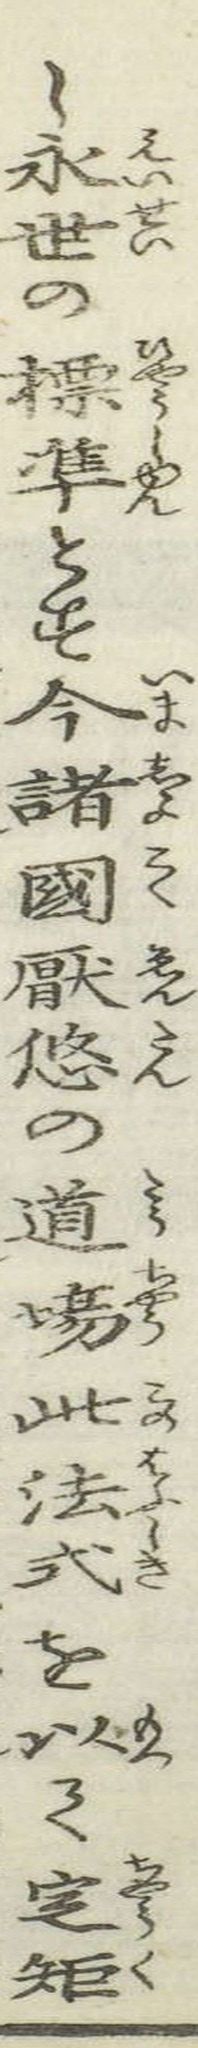し永世の標準とす今諸國厭悠の道場此法式を以て定矩
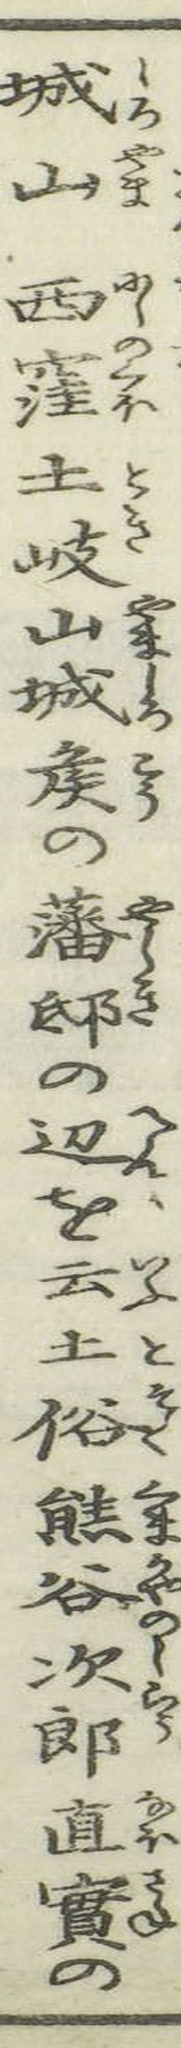城山西窪土岐山城侯の藩邸の辺を云土俗熊谷次郎直實の
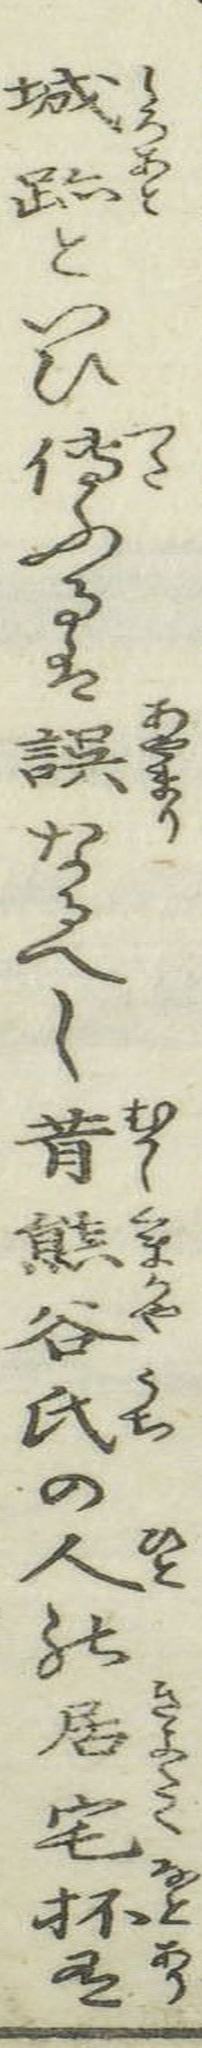城跡といひ傳ふるは誤なるへし昔熊谷氏の人の居宅抔有
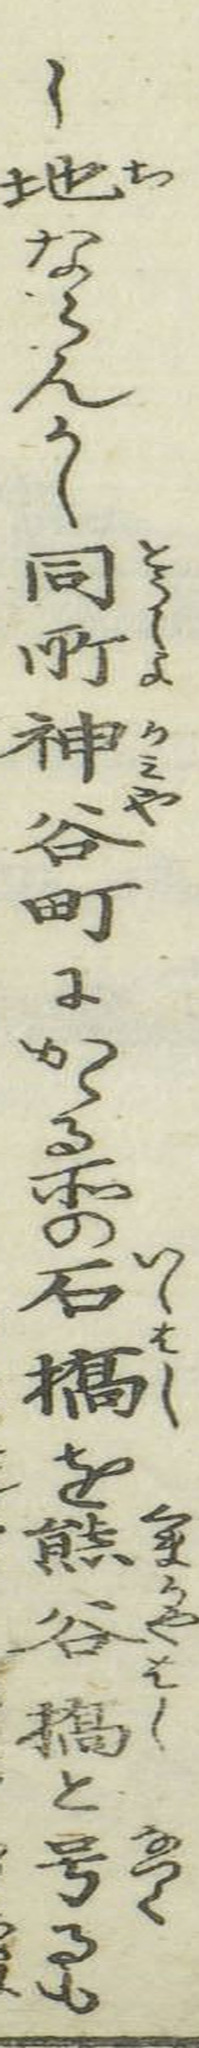し地ならんかし同所神谷町にかゝる所の石橋を熊谷橋と号るも

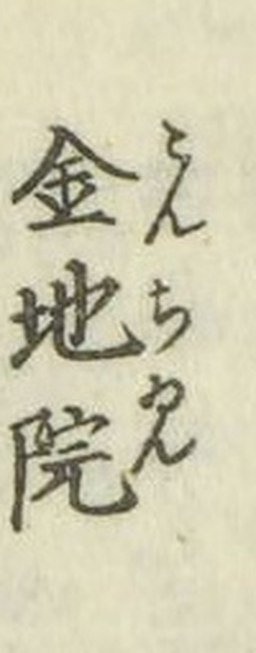金地院

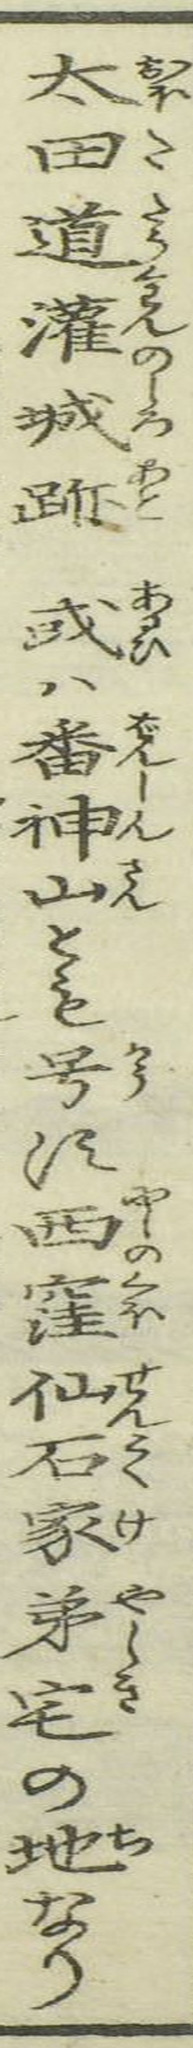太田道灌城跡或は番神山とも号す西窪仙石家弟宅の地なり
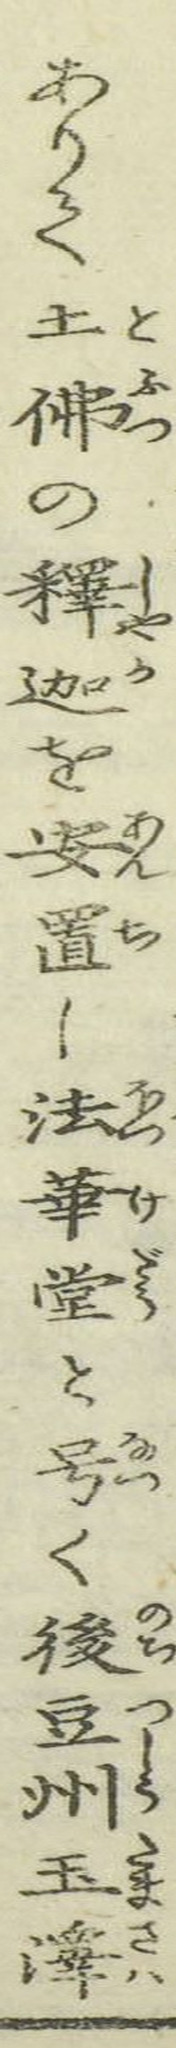ありて土佛の釈迦を安置し法華堂と号く後豆州玉澤
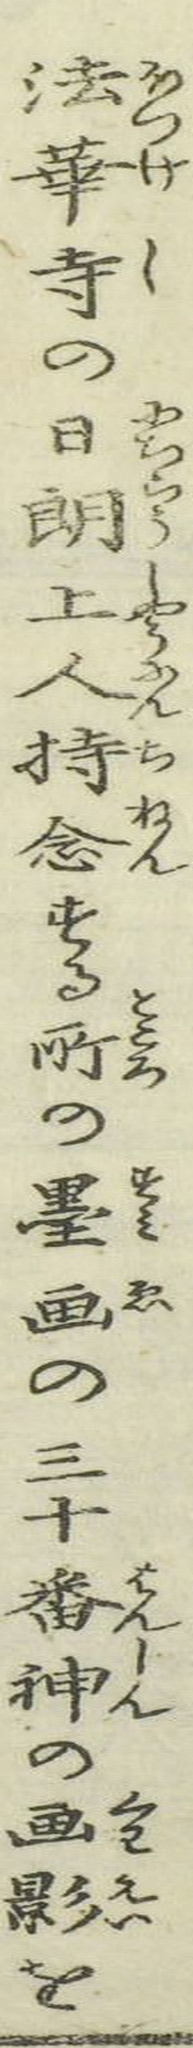法華寺の日朗上人持念する所の墨画の三十番神の画影を
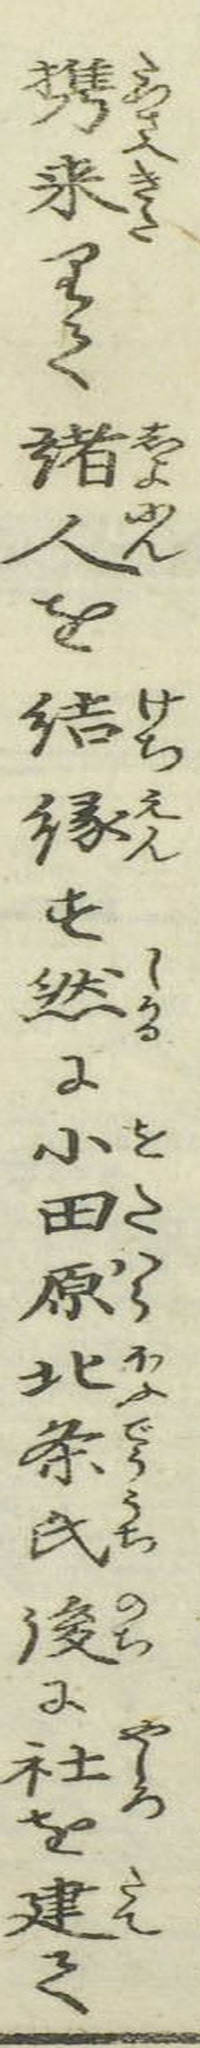携来りて諸人を結縁す然に小田原北条氏後に社を建て
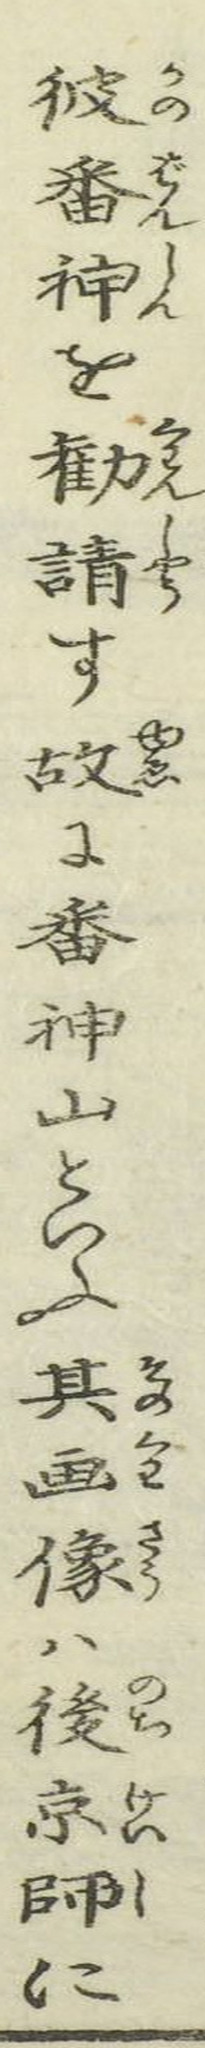彼番神を勧請す故に番神山といふ其画像は後京師に
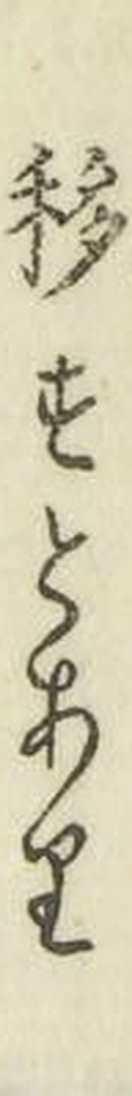移すとあり
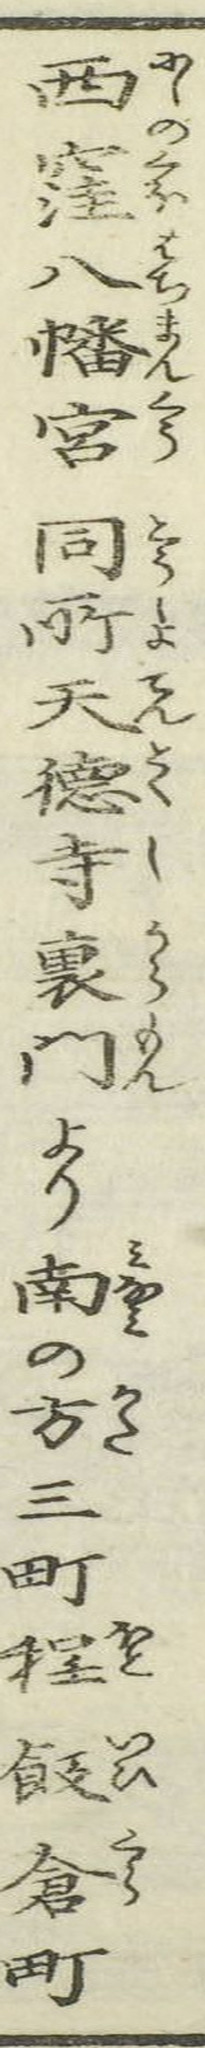西窪八幡宮同所天徳寺裏門より南の方三町程飯倉町
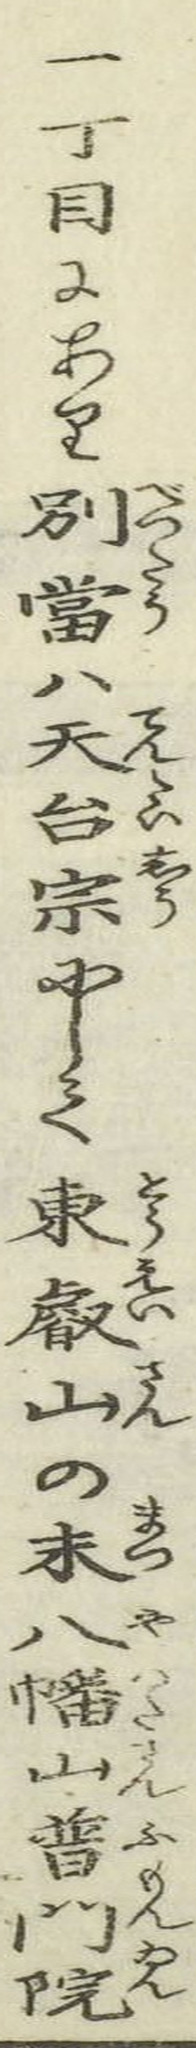一丁目にあり別當は天台宗にして東叡山の末八幡山普門院
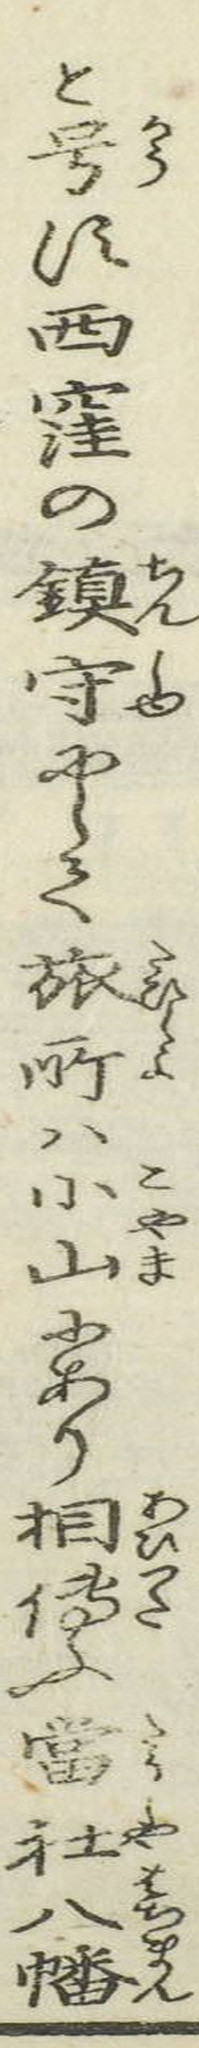と号す西窪の鎮守にして旅所は小山にあり相傳ふ當社八幡
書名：江戸名所図会 20巻 巻之3
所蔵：東京学芸大学教育コンテンツアーカイブ
